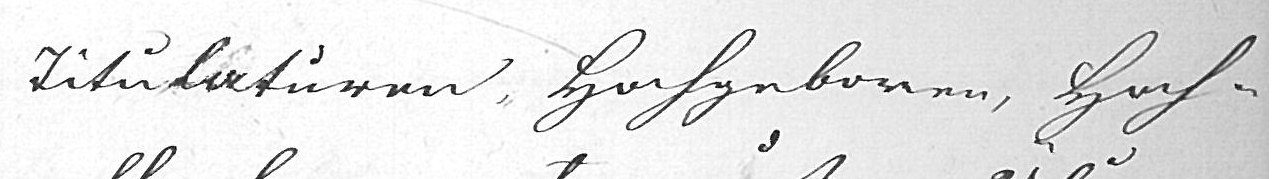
Titulaturen Hochgeboren, Hoch-
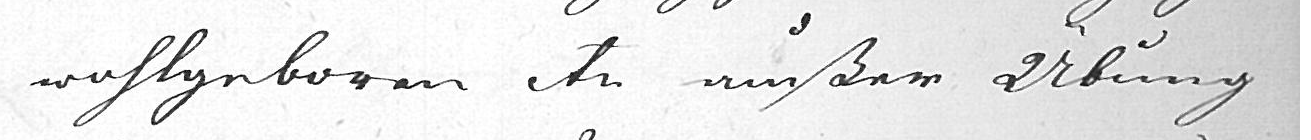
wohlgeboren etc. außer Übung
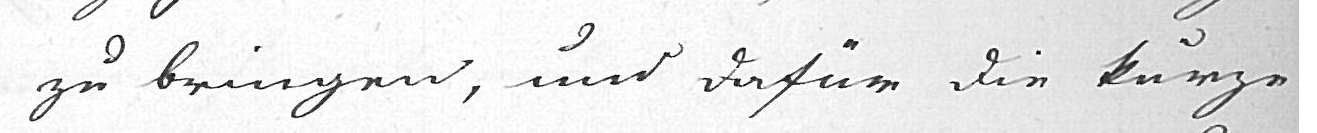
zu bringen, und dafür die kurze
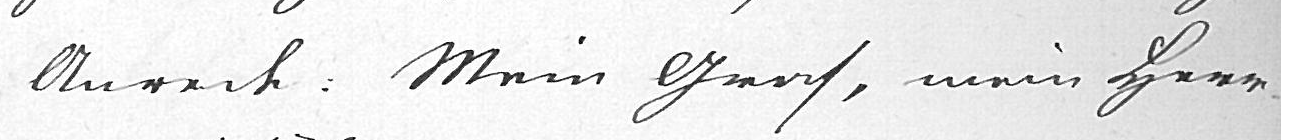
Anrede: Mein Graf, mein Herr
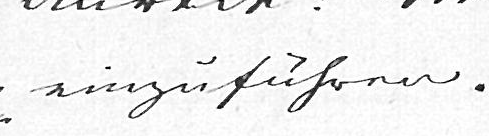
einzuführen.
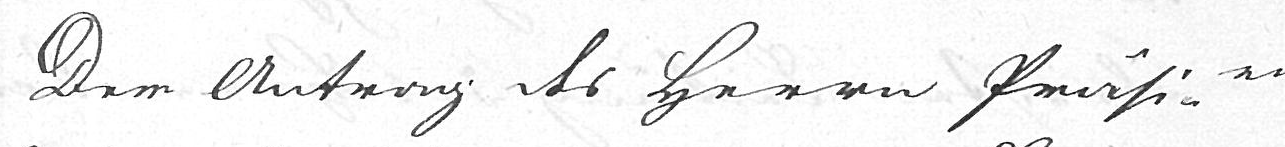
Der Antrag des Herrn Präsidi-
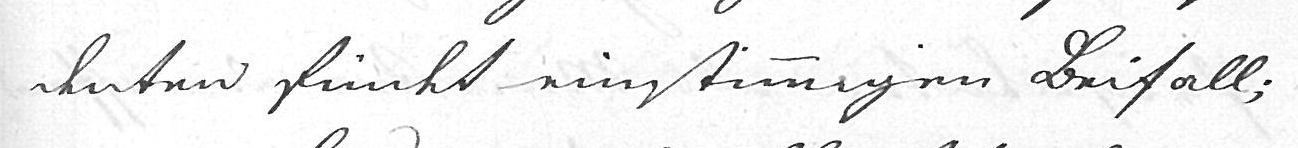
denten findet einstmmigen Beifall;
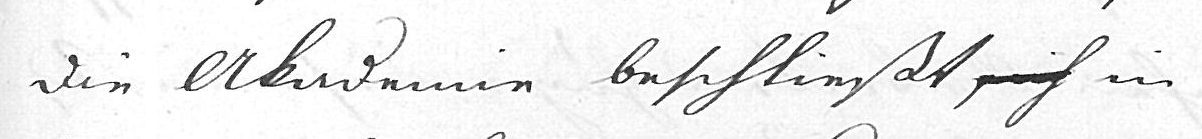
die Akademie beschließt sich in
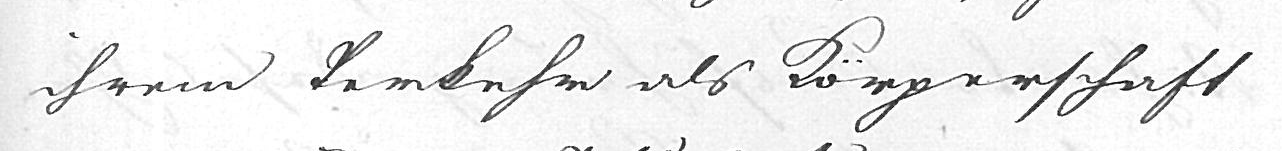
ihren Verkehr als Körperschaft
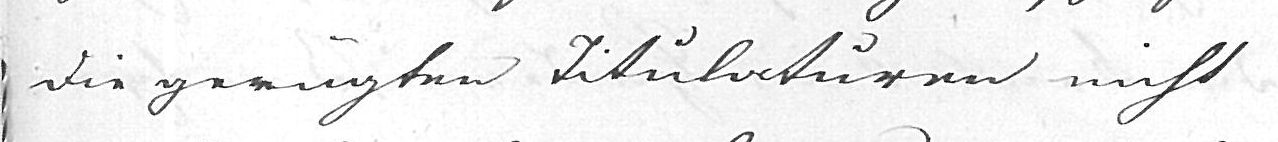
die gerügten Titulaturen nicht
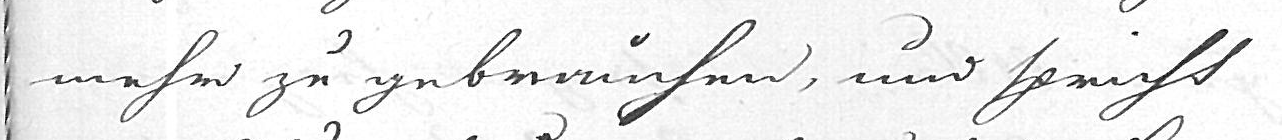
mehr zu gebrauchen, und spricht
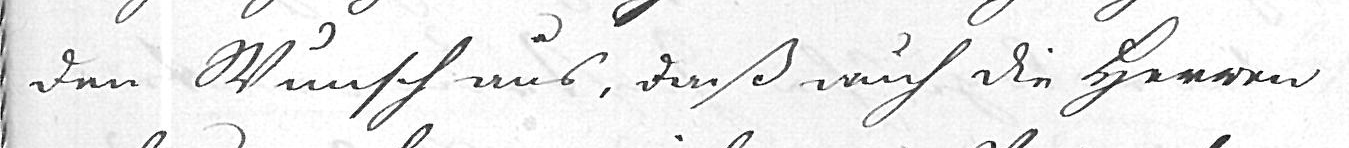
den Wunsch aus, daß sich die Herren
